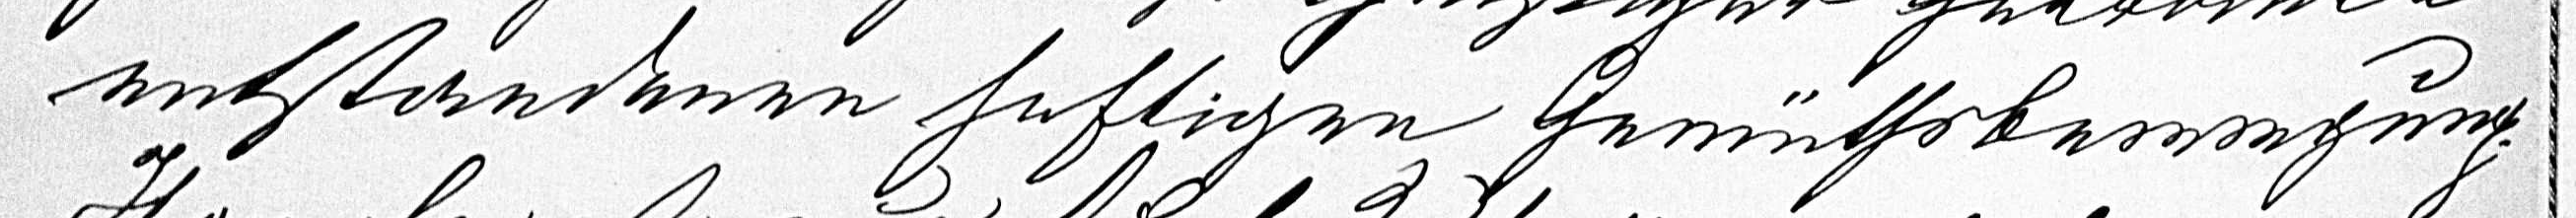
entstandenen heftigen Gemüthsbeweung.
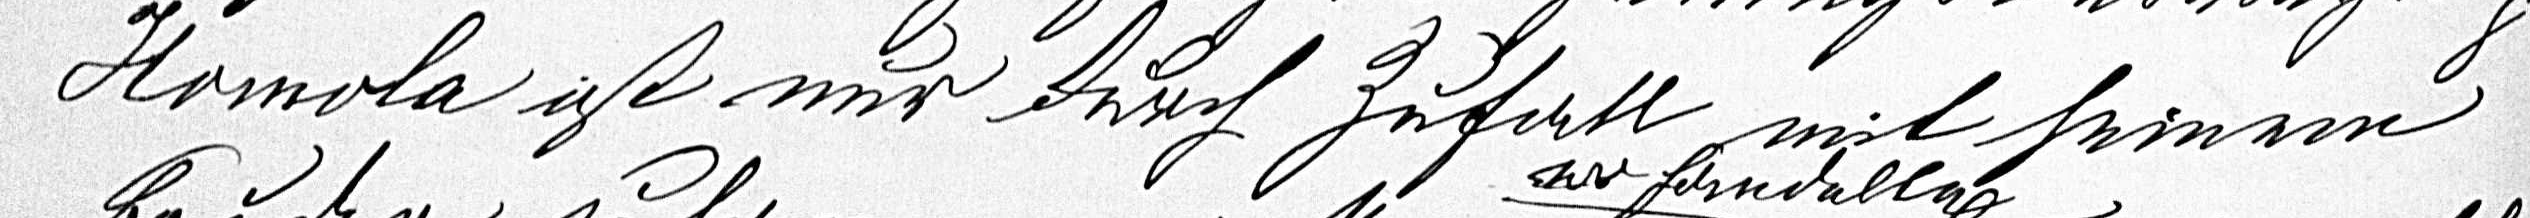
Homola ist nur durch Zufall mit seinem
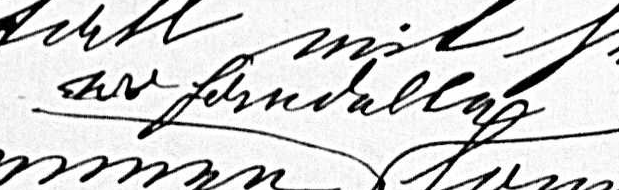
am Handelleg
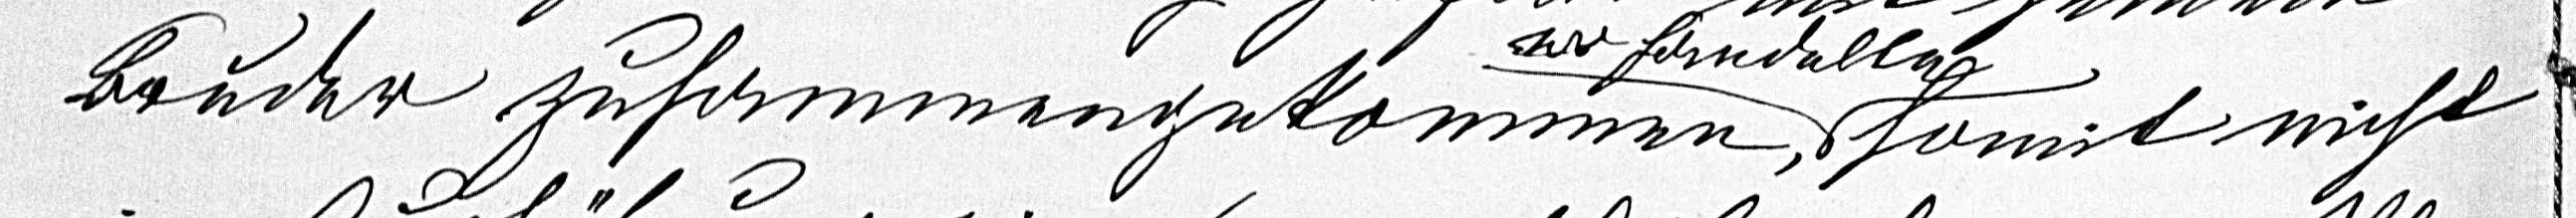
Bruder zusammengekommen somit nicht
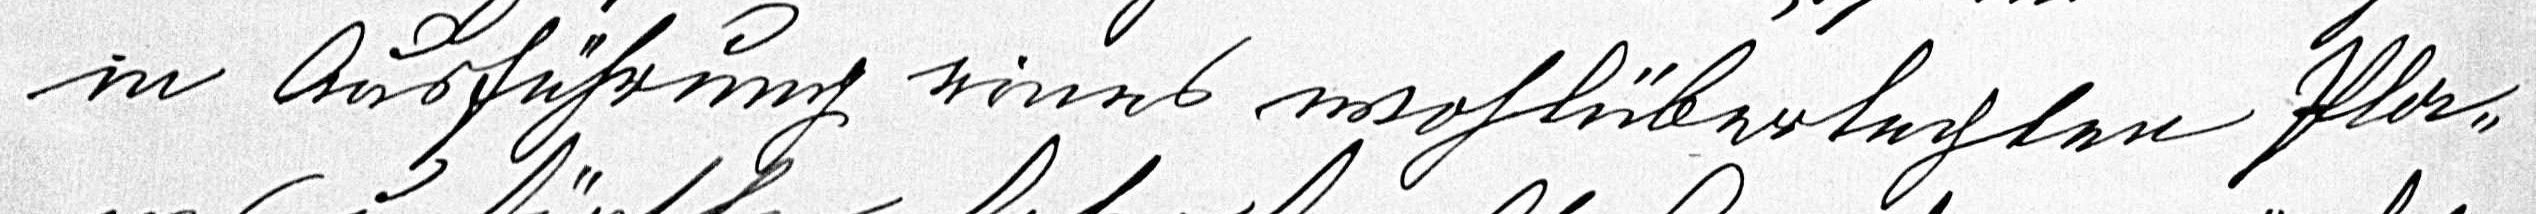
in Ausführung eines wohlüberlegten Pla¬
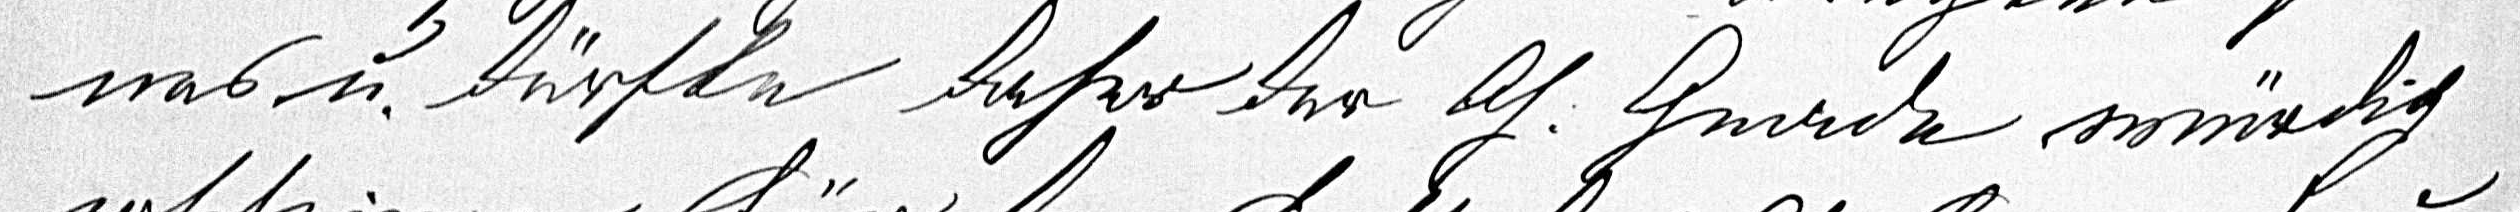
nes u. dürfte daher der Ah. Gnade würdig
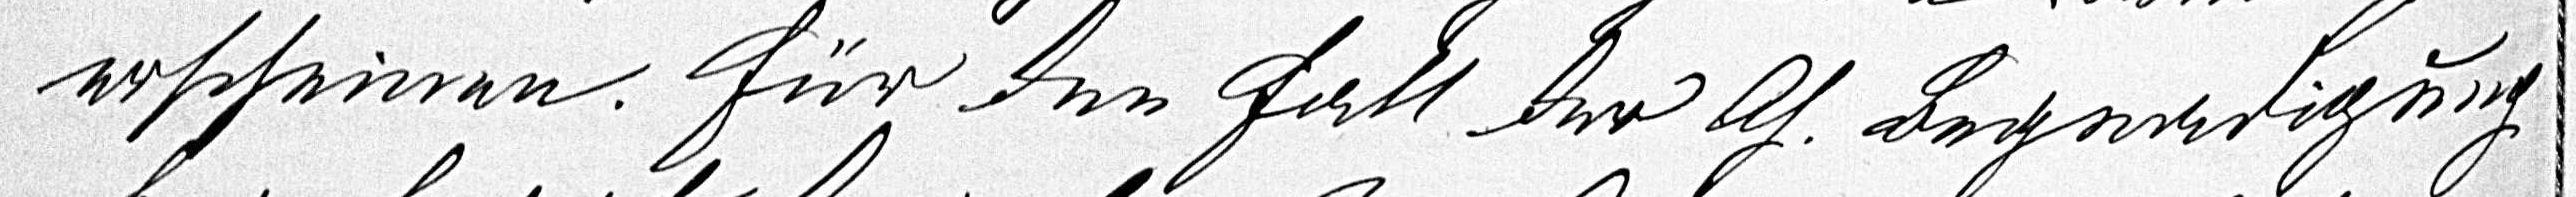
erscheinen. Für den Fall der Ah. Begnadigung
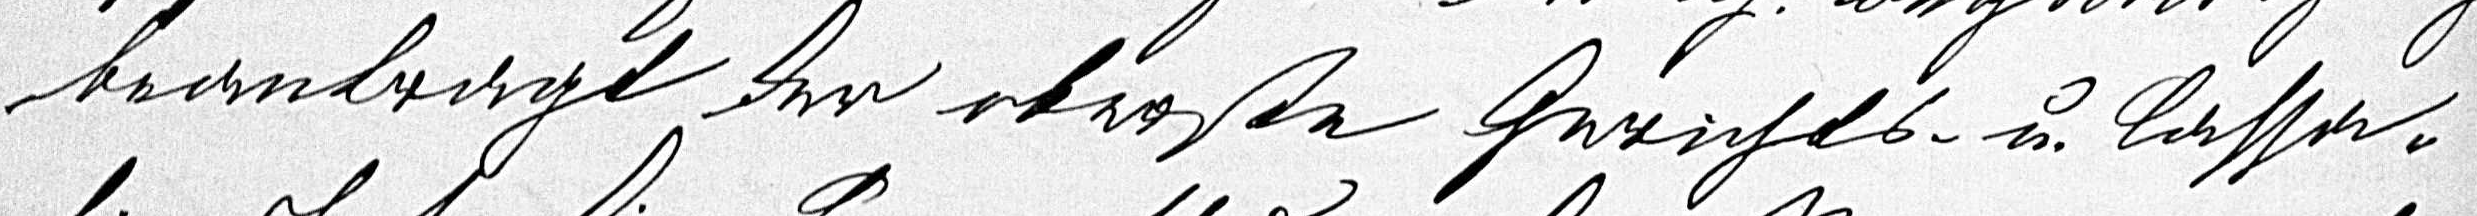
beantragt der oberste Gerichts- u. Cassa¬
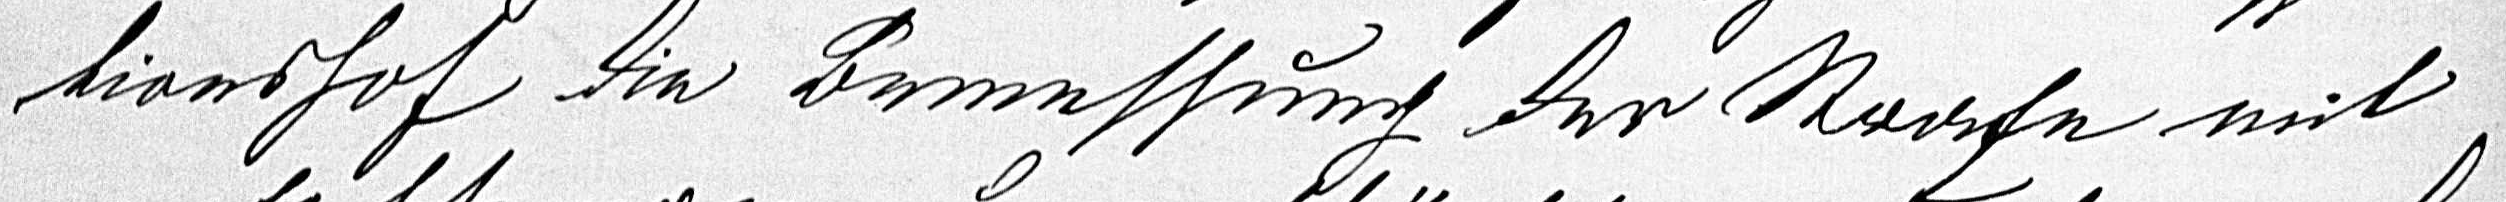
tionshof die Bemessung der Strafe mit
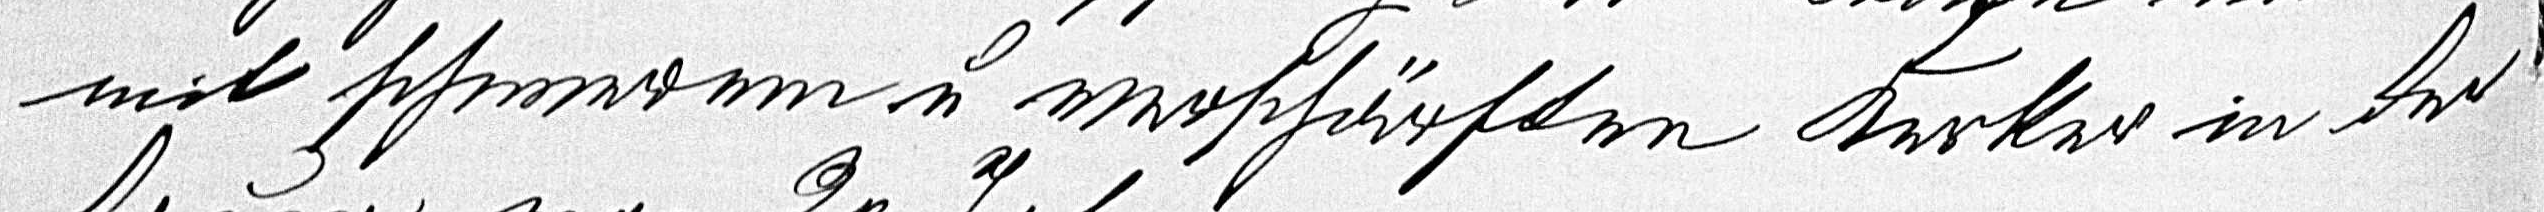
mit schwerem u. verschärften Kerker in der
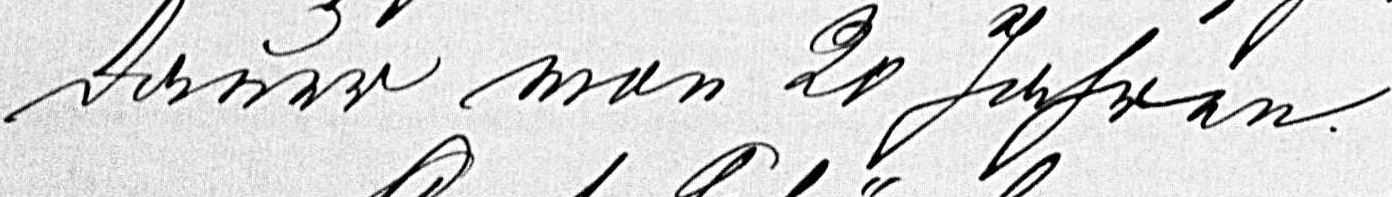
Dauer von 20 Jahren.
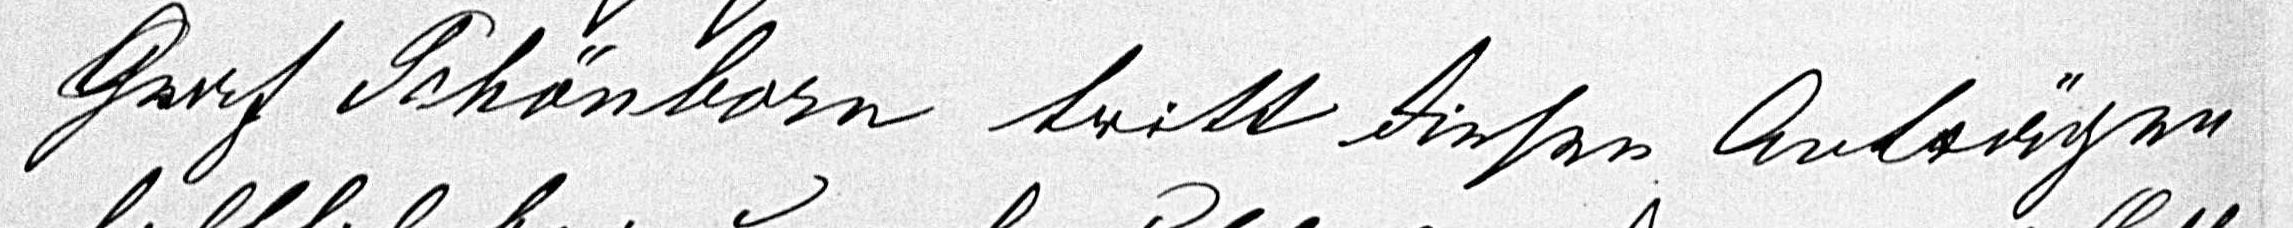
Graf Schönborn tritt diesen Anträgen
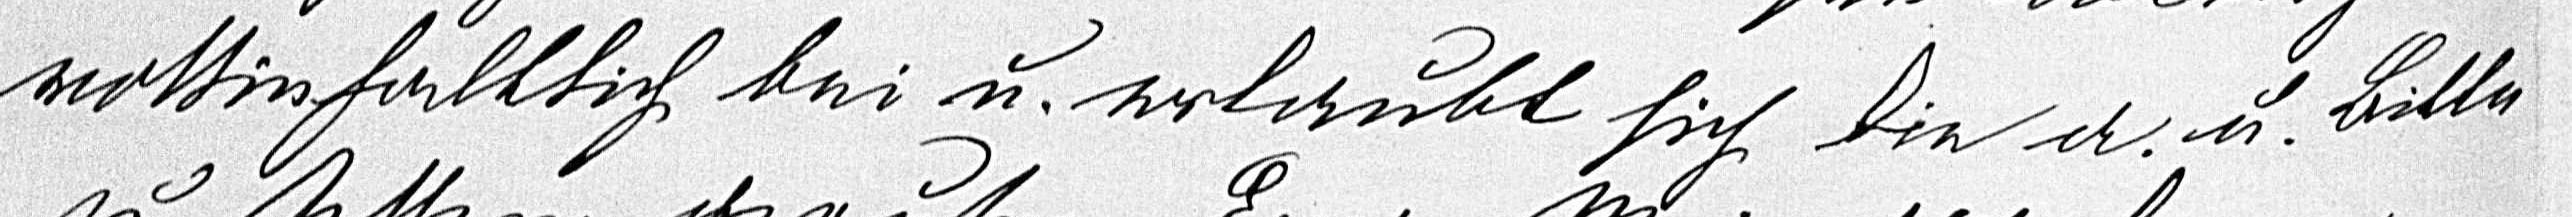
vollinhaltlich bei u. erlaubt sich die a.u. Bitte
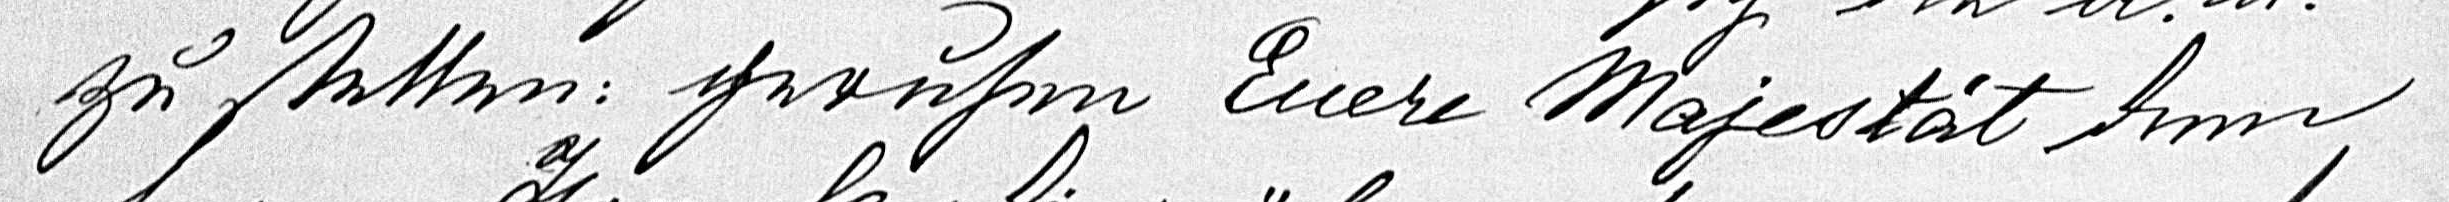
zu stellen: geruhen Euere Majestät dem
